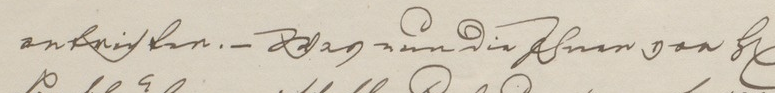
entrichten. – Was nun die Ihnen von Hrn.
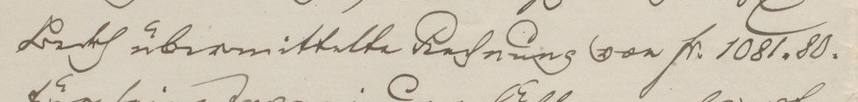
Beckh übermittelte Rechnung von Fr. 1081.80–
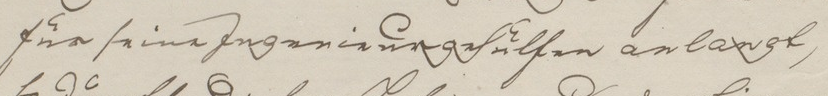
für seine Ingenieurgehülfen anlangt,
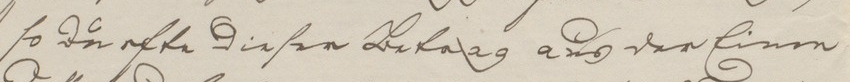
so dürfte dieser Betrag aus der Einen
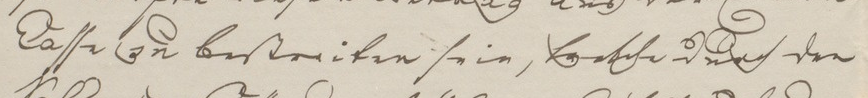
Kasse zu bestreiten sein, welche durch den
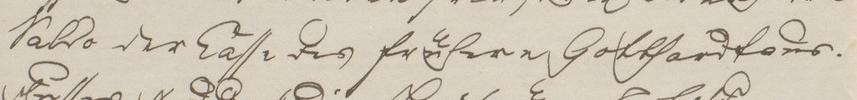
Saldo der Kasse des frühern Gotthardtaus-
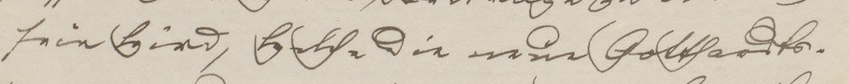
sein wird, welche die neue Gotthardts -
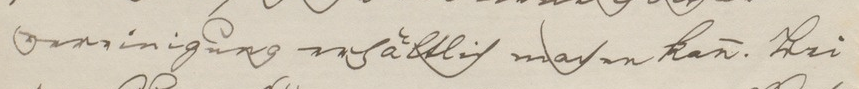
vereinigung erhältlich machen kann. Bei
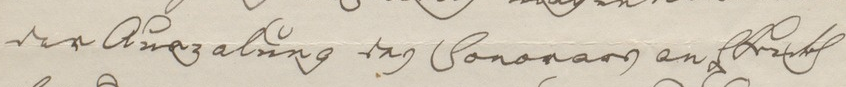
der Auszalung des Honorars an Hrn Beckh
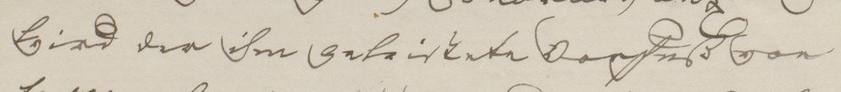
wird der ihm geleistete Vorschuß von
